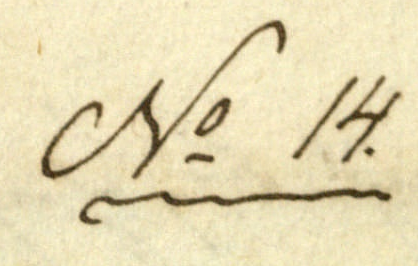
No 14.
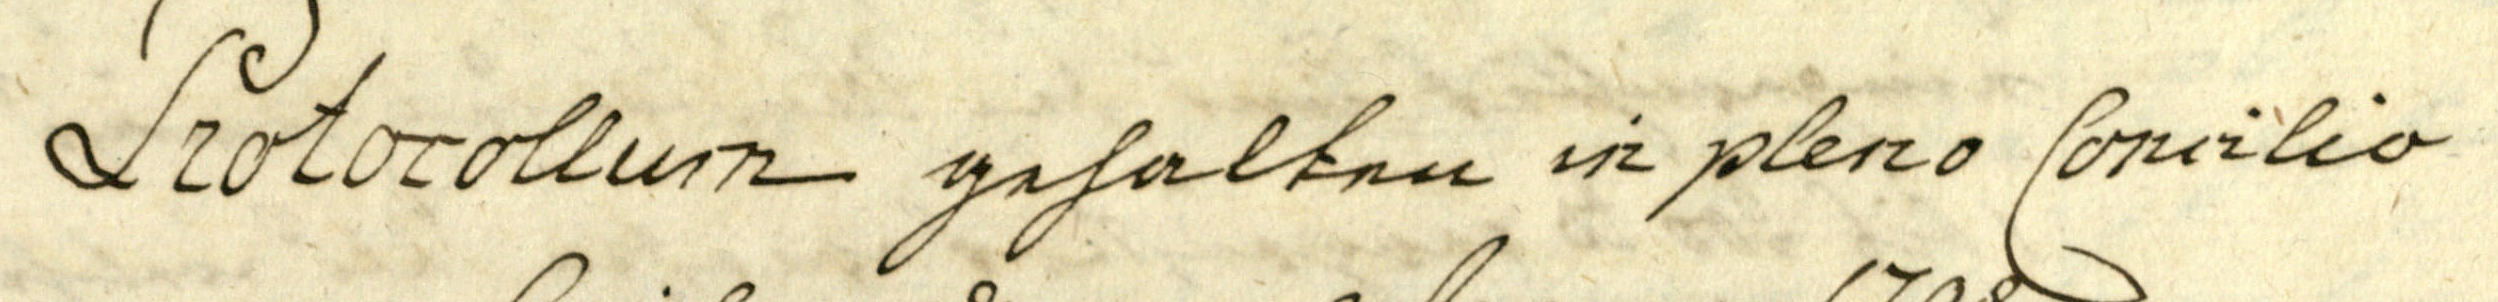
Protocollum gehalten in pleno Concilio
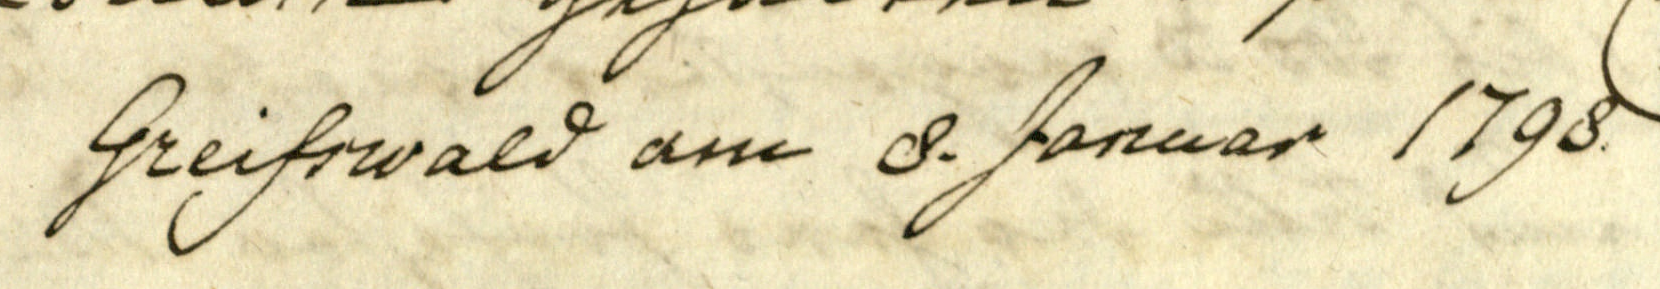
Greifswald am 8. Januar 1798
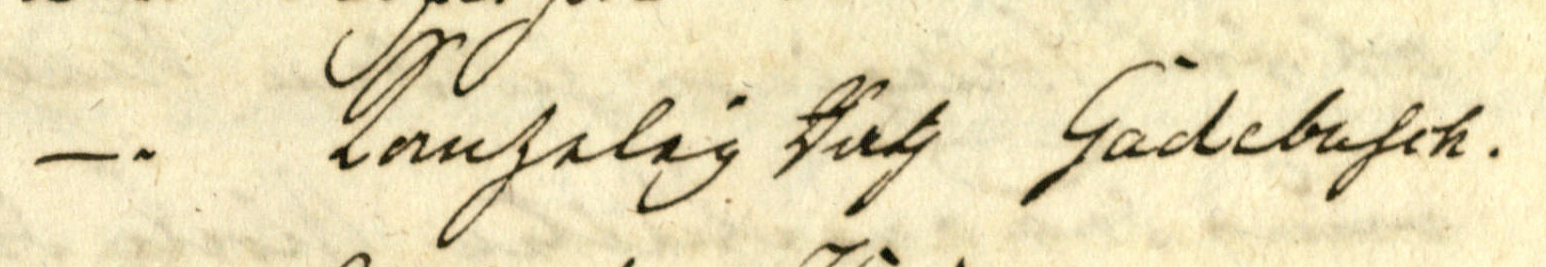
Kanzeleÿ Rath Gadebusch.
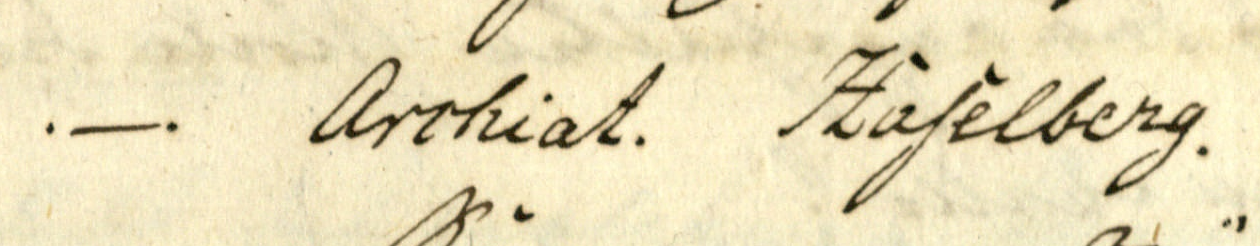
Archiat. Haselberg.
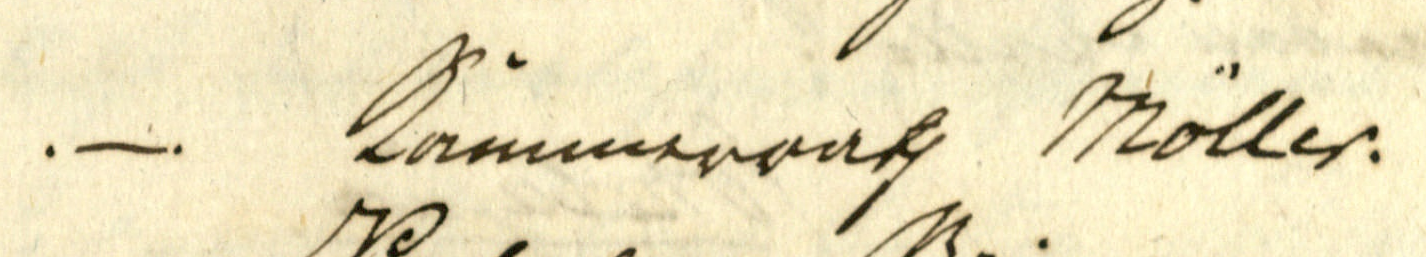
Kammerrath Möller.
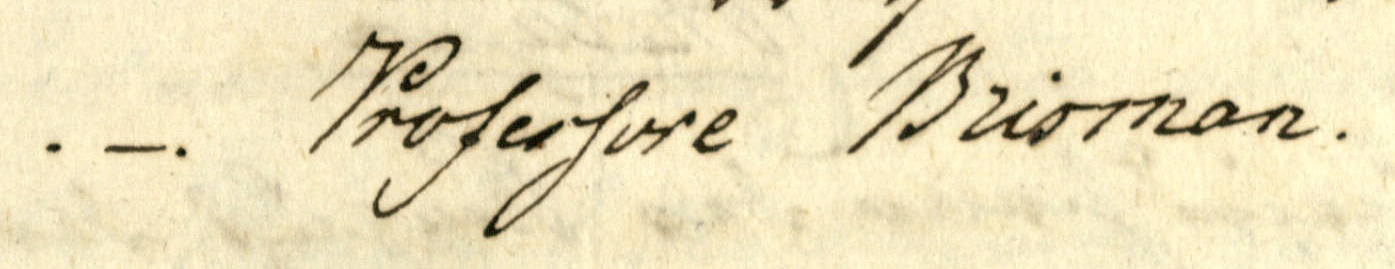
Professore Brisman.
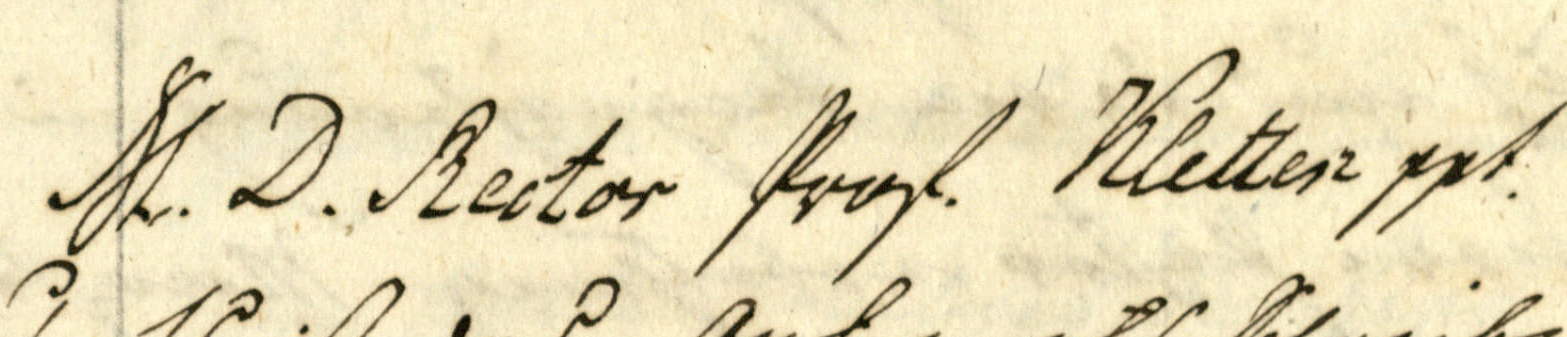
M. D. Rector Prof. Kletten ppt.
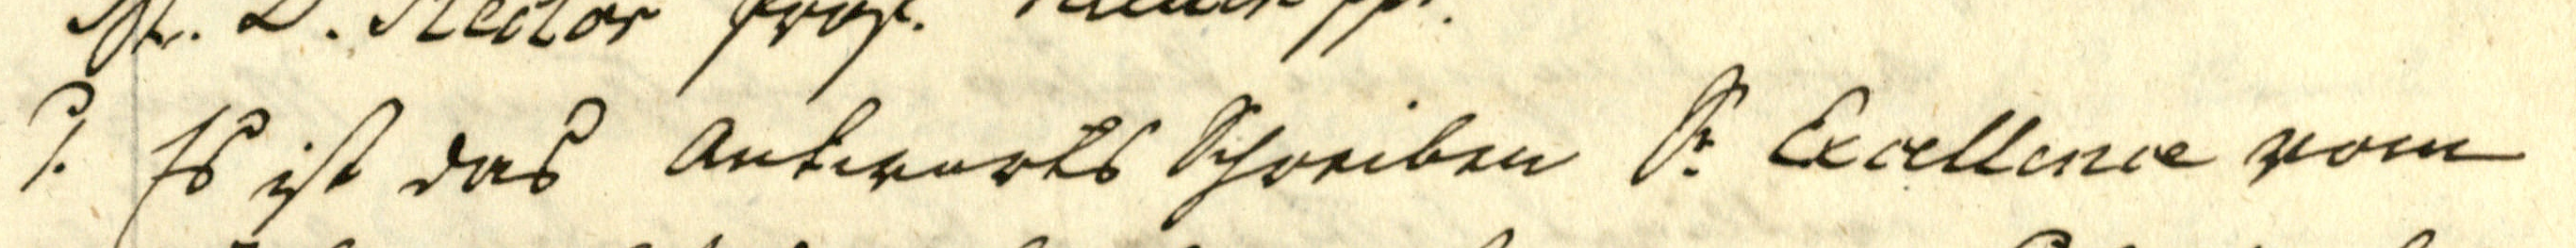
1. Es ist das Antworts Schreiben Sr Excellence vom
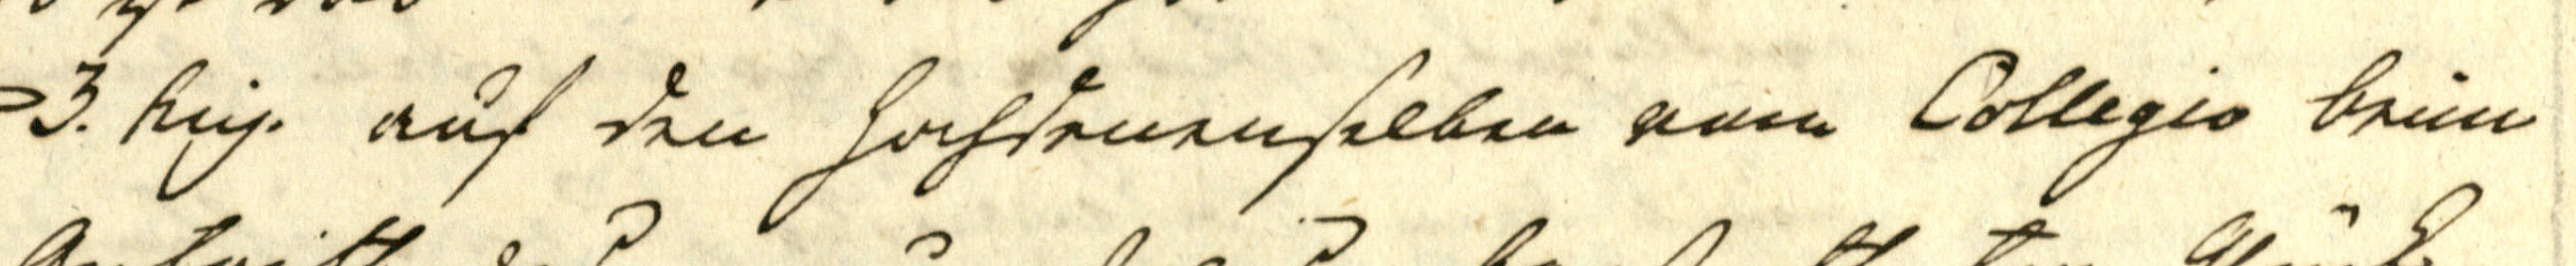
3. huj. auf den Hochdenenselben vom Collegio beim
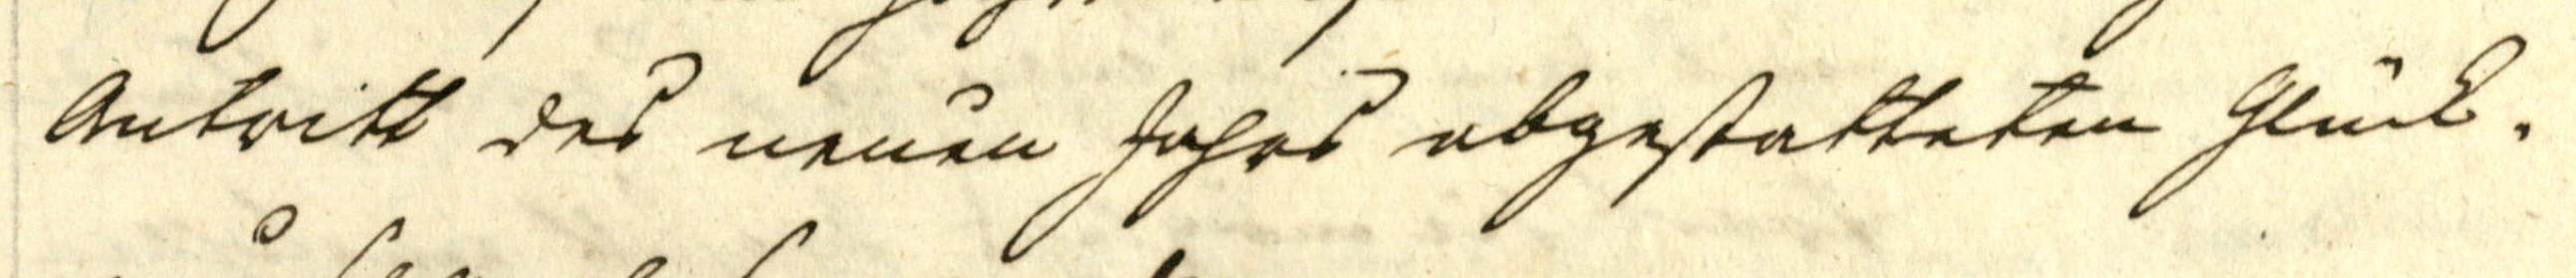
Antritt des neuen Jahrs abgestatteten Glück¬
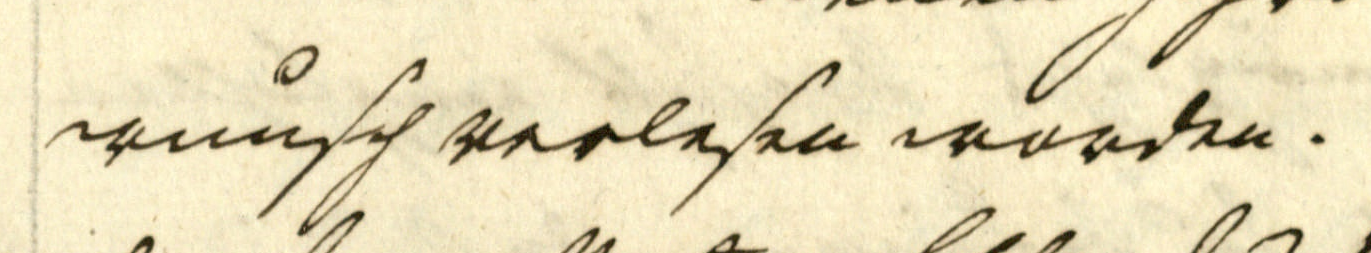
wunsch verlesen worden.
